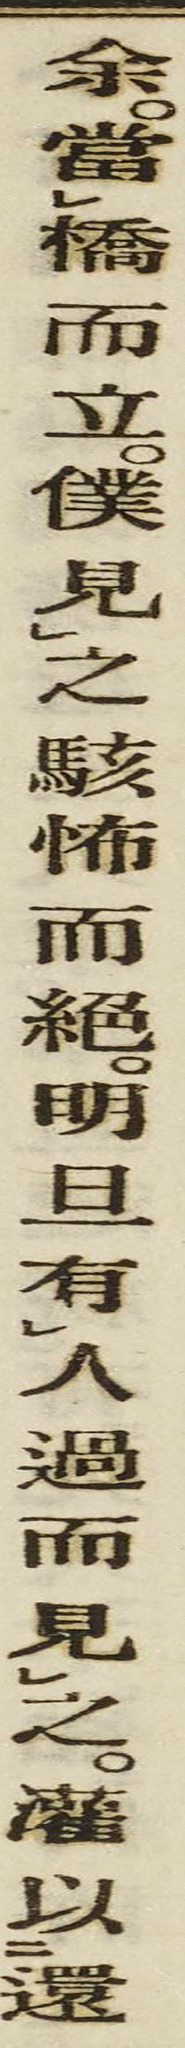余。当橋而立。僕見之駭怖而絶。明旦有人過而見之。灌以ニ還
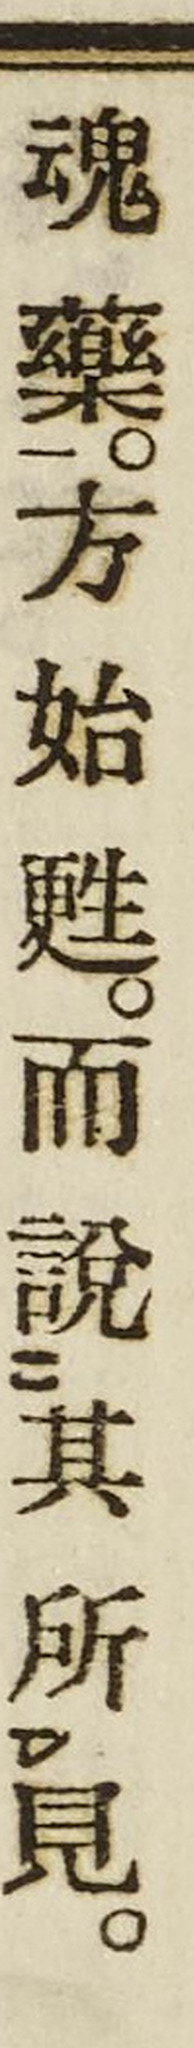魂薬。方始甦。而説ニ其所レ見。
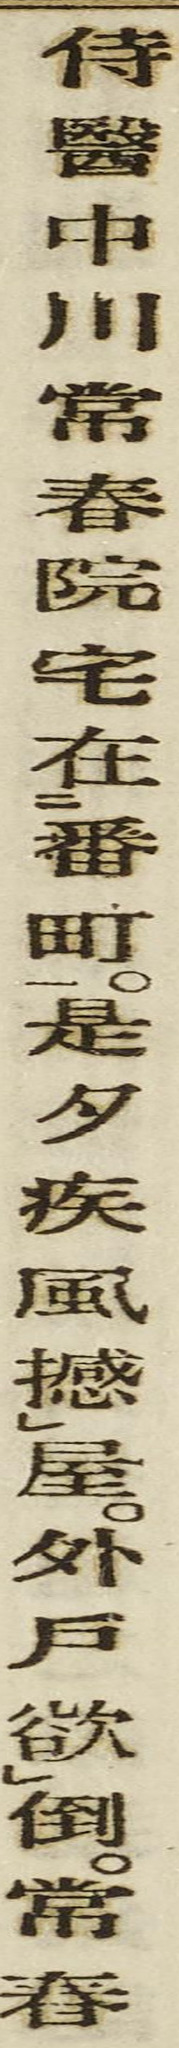侍医中川常春院宅在ニ番町。是夕疾風撼屋。外戸欲倒。常春
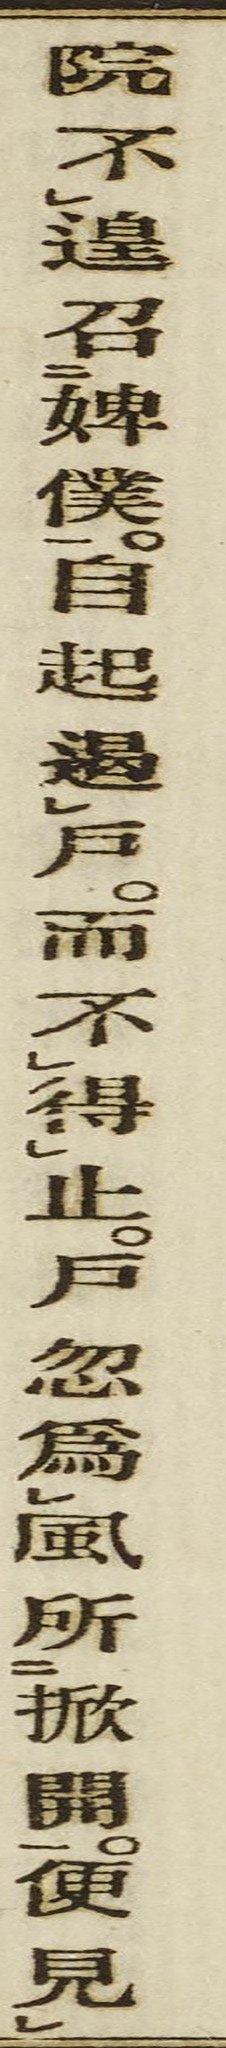院不遑召ニ婢僕。自起遏戸。而不得止。戸忽為風所ニ掀開。便見

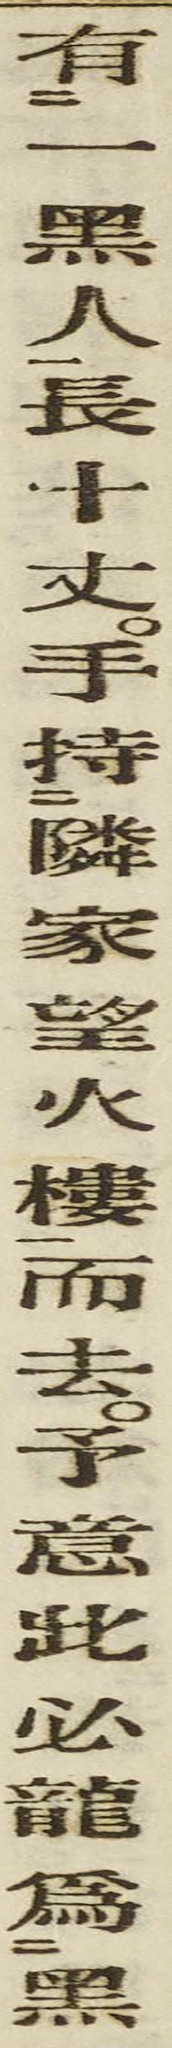有ニ一黒人長十丈。手持ニ隣家望火楼而去。予意此必龍為ニ黒
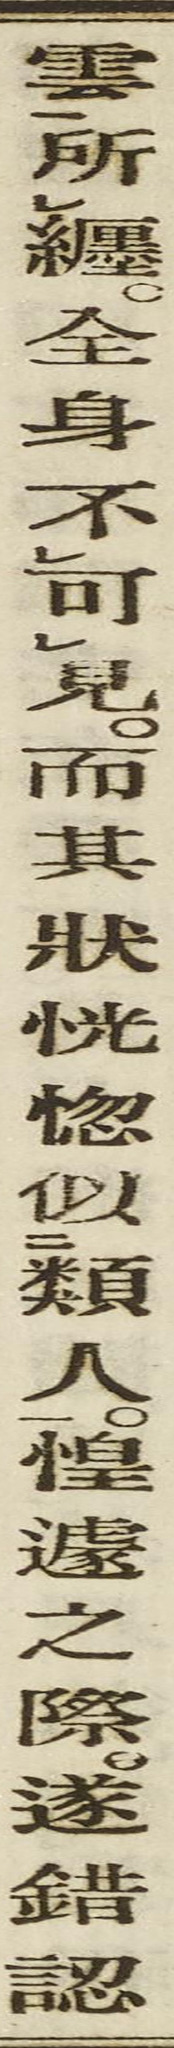雲所纏。全身不可見。而其状恍惚似ニ類人。惶遽之際。遂錯認
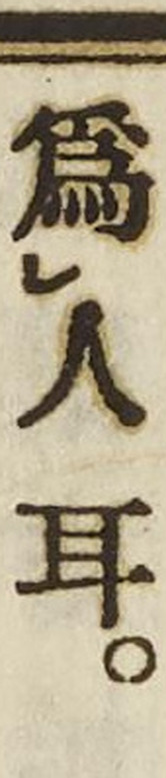為人耳。
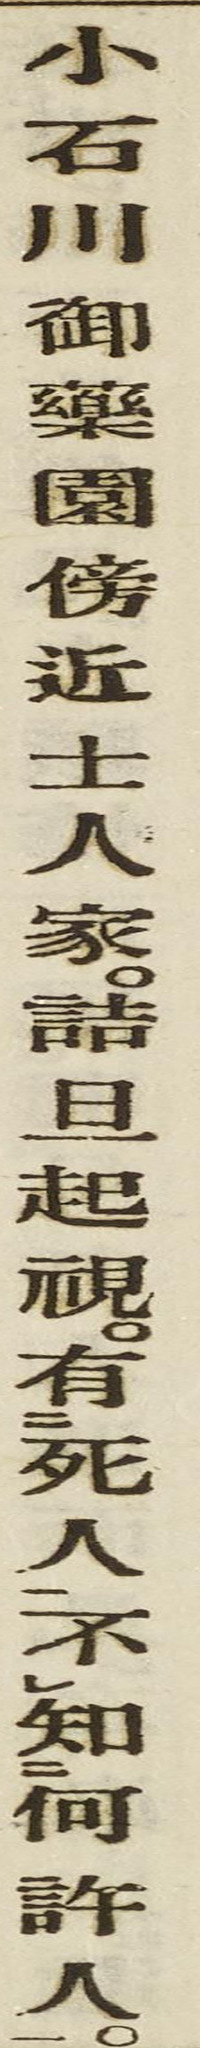小石川御薬園傍近士人家。詰旦起視。有ニ死人不知ニ何許人。
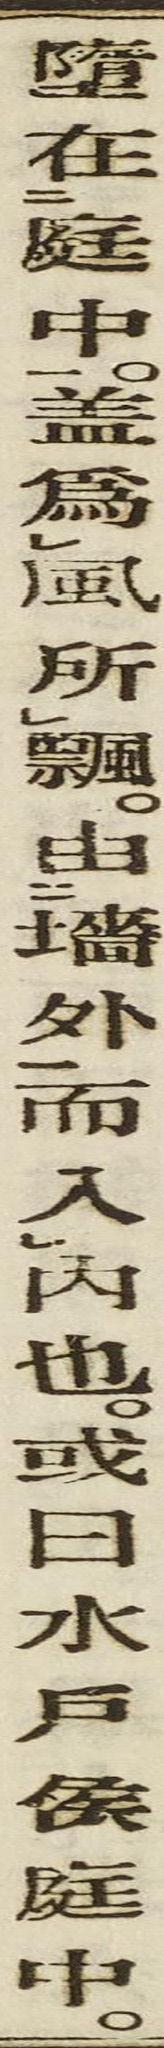堕在ニ庭中。盖為風所飄。由ニ墻外而入内也。或曰水戸侯庭中。
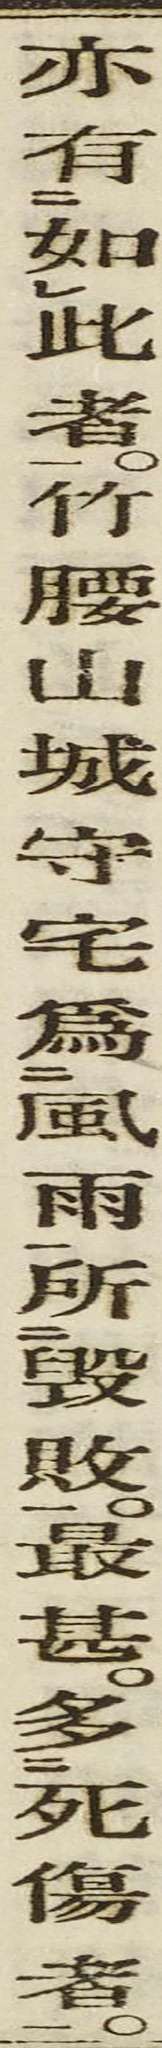亦有ニ如此者。竹腰山城守宅為ニ風雨所ニ毀敗。最甚。多ニ死傷者。
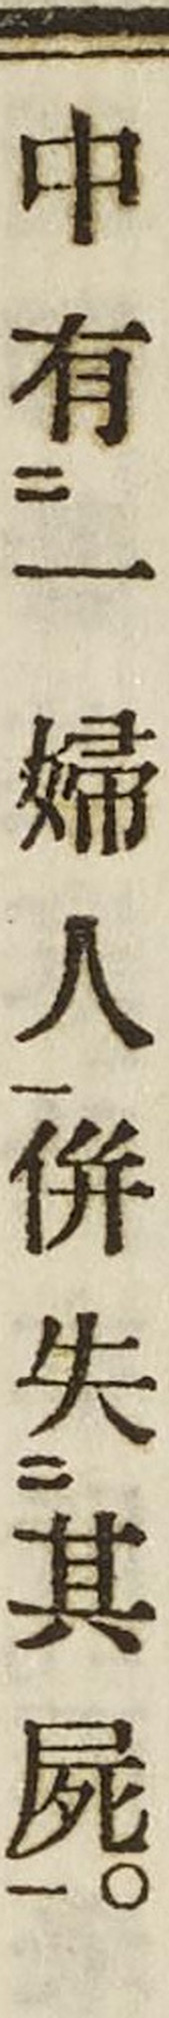中有ニ一婦人併失ニ其屍。
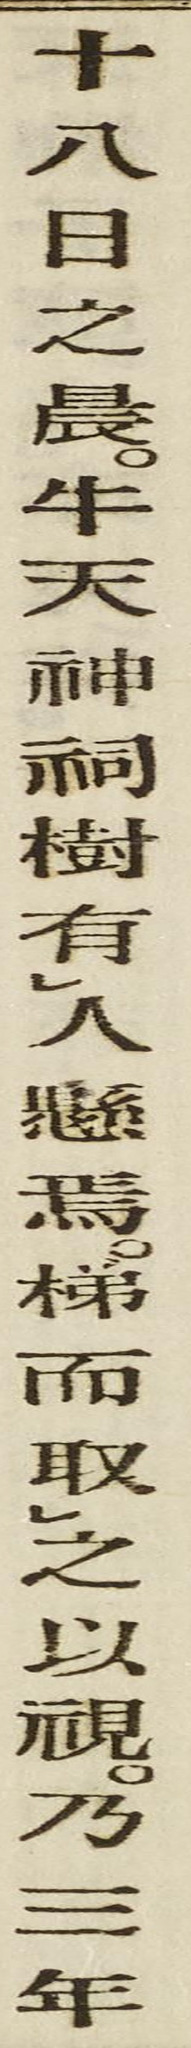十八日之晨。牛天神祠樹有人懸焉。梯而取之以視。乃三年
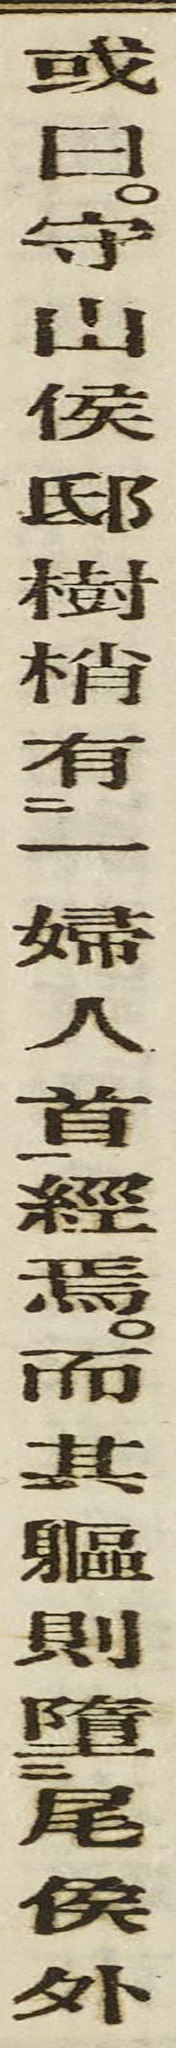或曰。守山侯邸樹梢有ニ一婦人首経焉。而其躯則堕ニ尾侯外
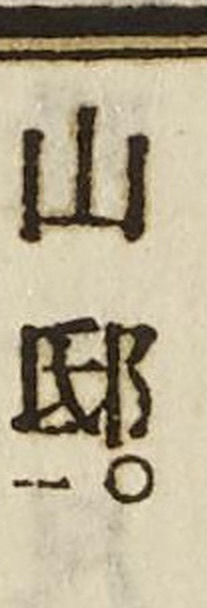山邸。
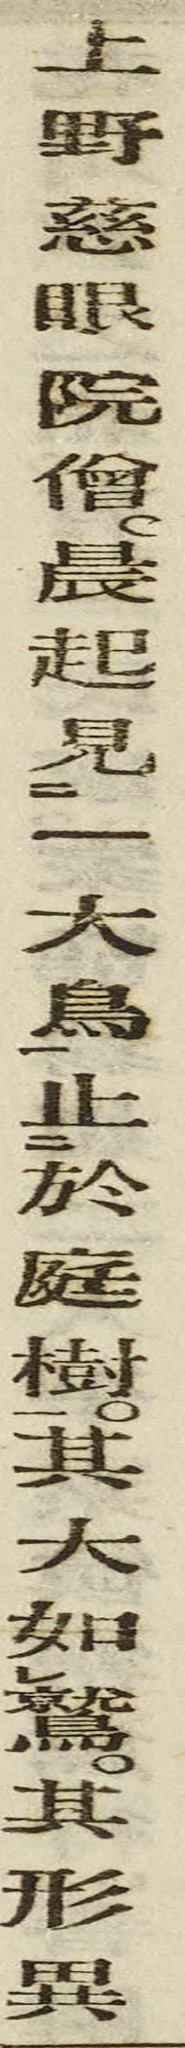上野慈眼院僧。晨起見ニ一大鳥止ニ於庭樹。其大如鷲。其形異
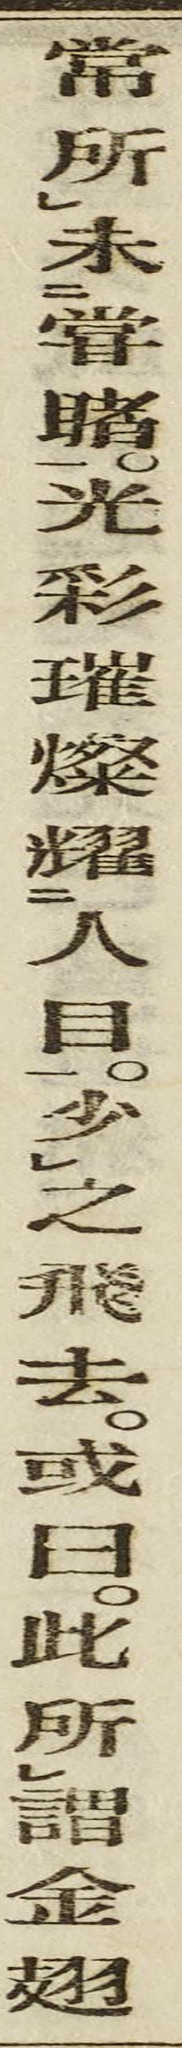常所未ニ嘗睹。光彩璀燦耀ニ人目。少之飛去。或曰。此所謂金翅
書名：史籍集覽　朝鮮陣古文・細井廣澤記・颶風紀事・天明七年將軍宣下次第書　全
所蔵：東京大学地震研究所図書室 Earthquake Research Institute Library, The University of Tokyo, JAPAN
